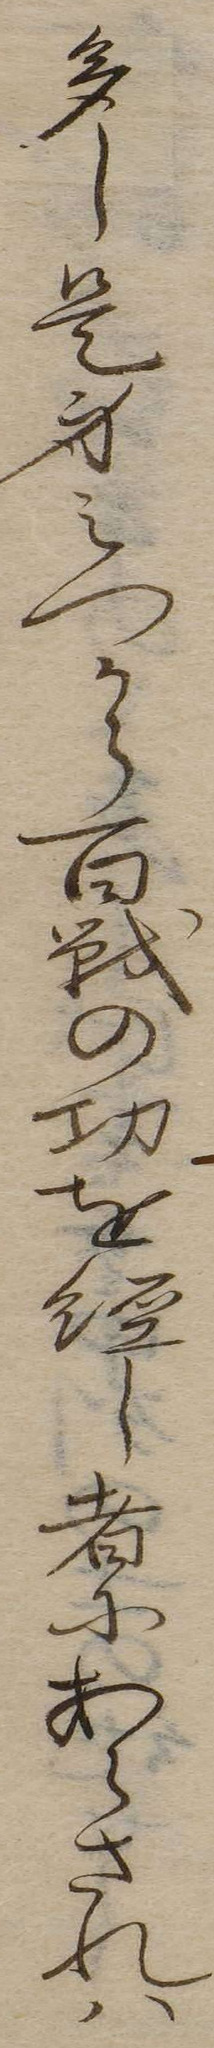多し是身みつから百戦の功を経し者にあらされは

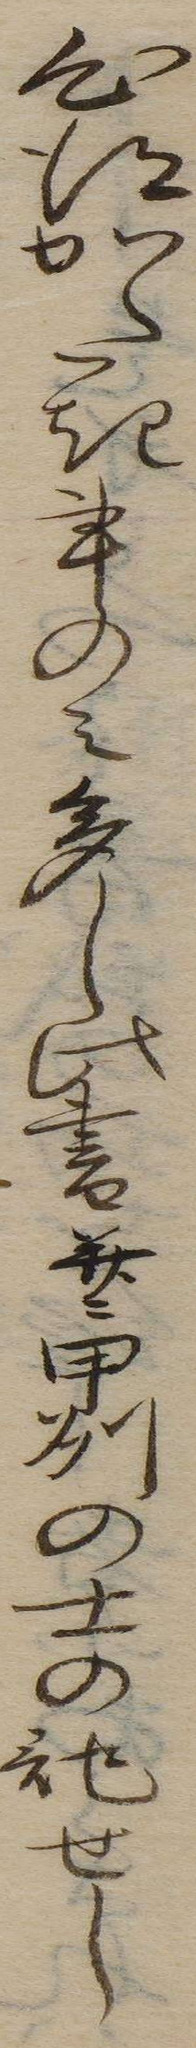心得かたき事のみ多し此書并ニ甲州の士の記せし
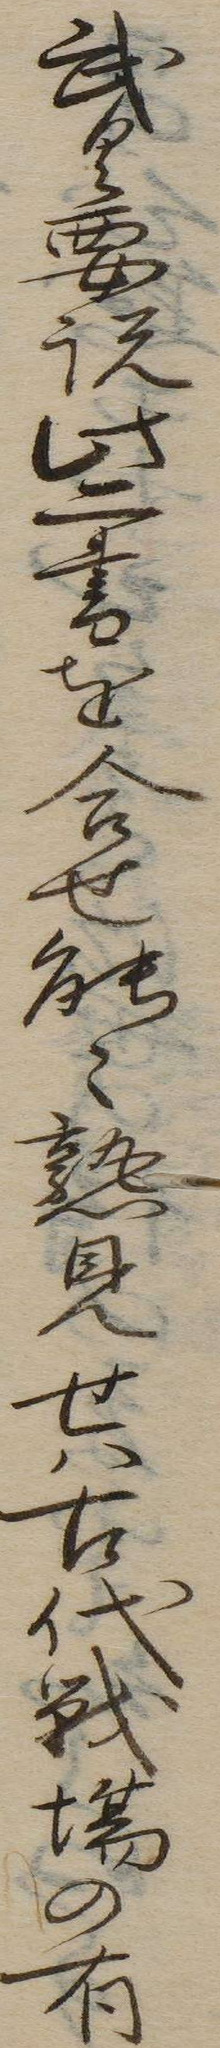武具要説此二書を合せ能々熟見せは古代戦場の有
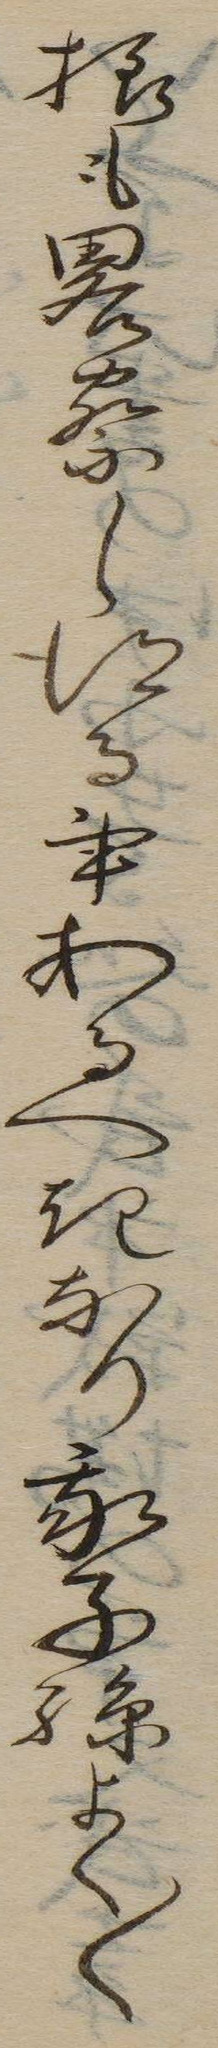様も略察し得る事あるへきなり我子孫よく〳〵
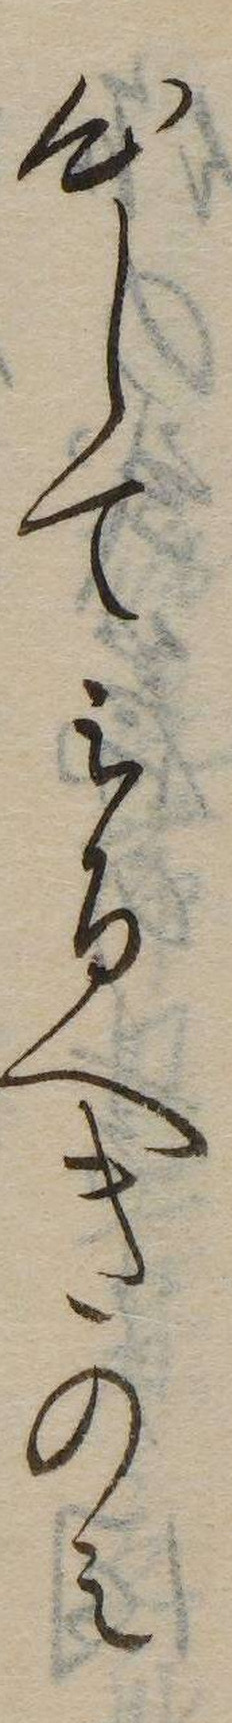心してみるへきのみ
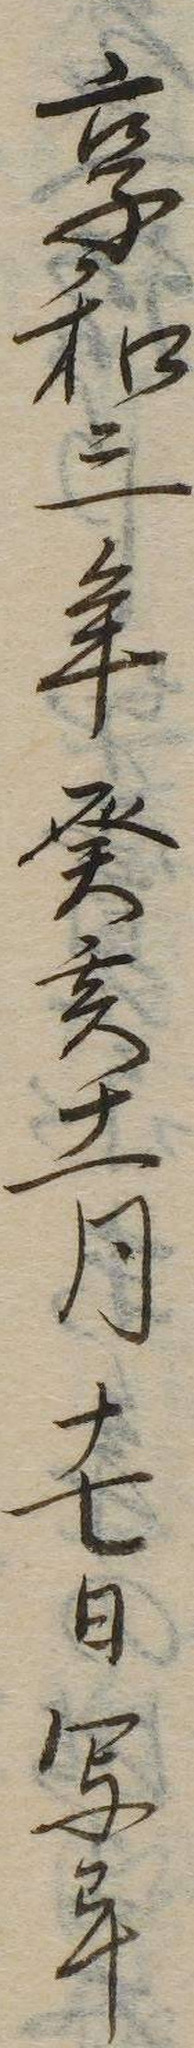享和三年癸亥十一月十七日写畢
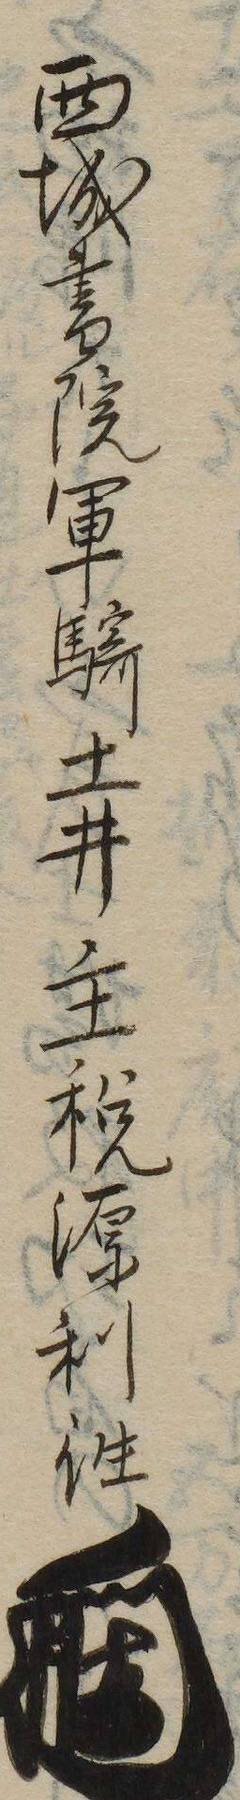西城書院軍騎土井主税源利往
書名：三河之物語
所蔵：国文学研究資料館
